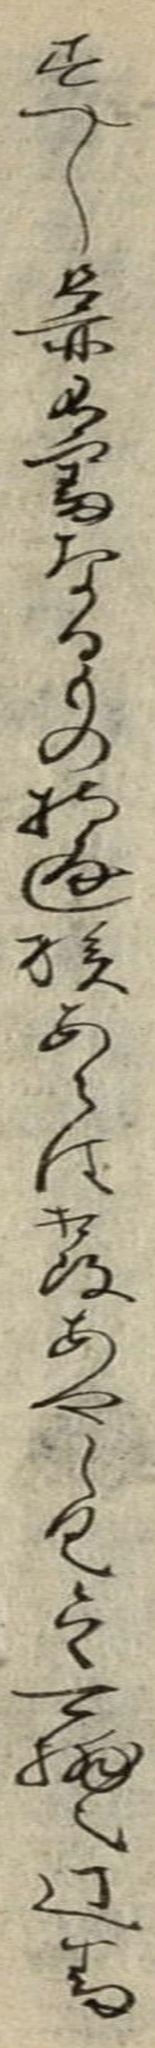すへし且亦不審なるもの持通族あらは相改あやしく候はゝ可捕之辻番
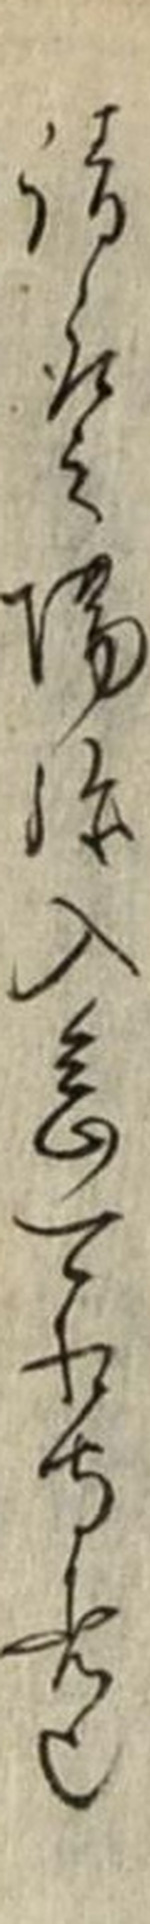請取之場弥入念可相守者也
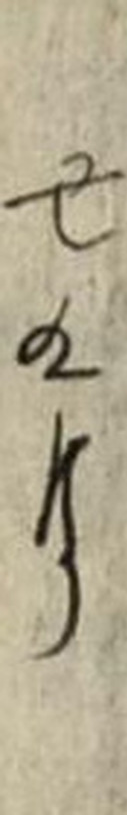丑九月
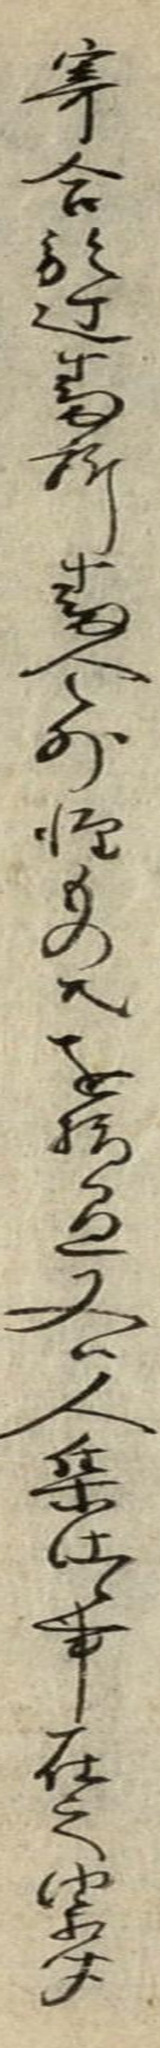寄合於辻番所番人之外軽もの共を指置又は人集仕候事在之由相聞
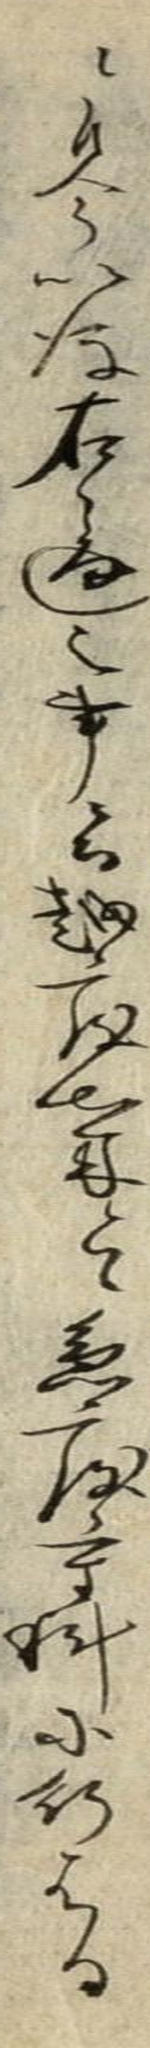候自今以後右之通之事にて越度出来候はゝ急度重科に行はる
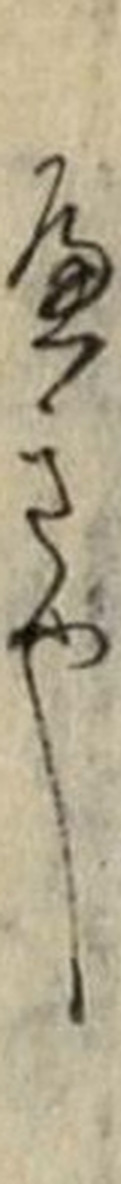へき也
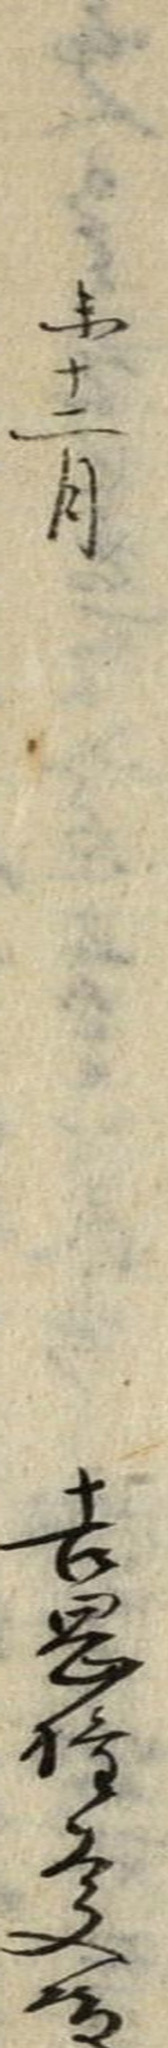未十二月吉岡権太夫殿
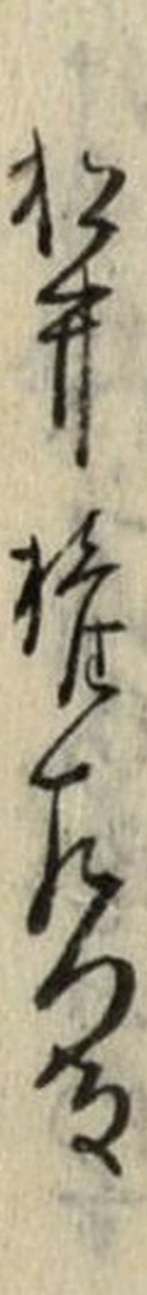松井権左衛門殿
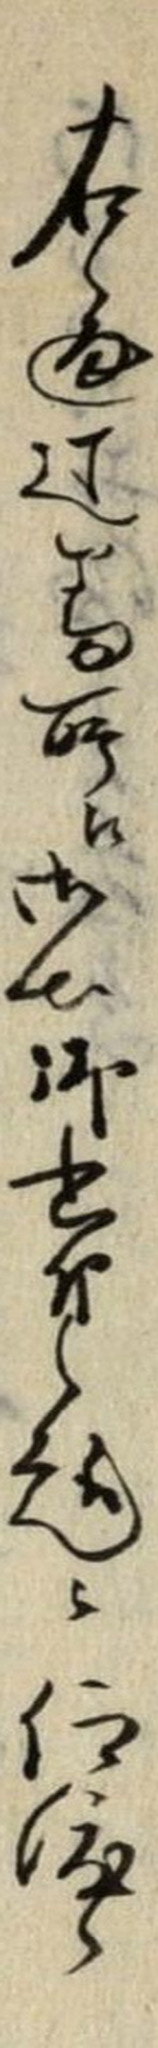右之通辻番所江御出御書付之趣被仰渡候
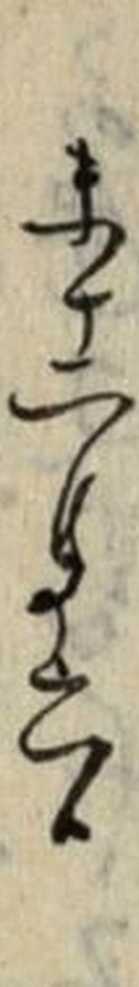未十二月六日
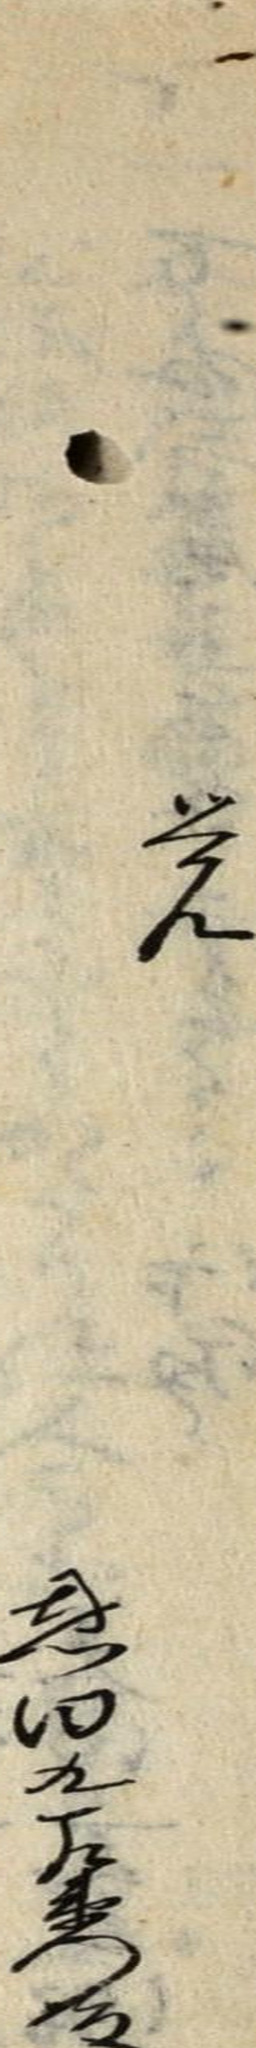恩田九左衛門殿
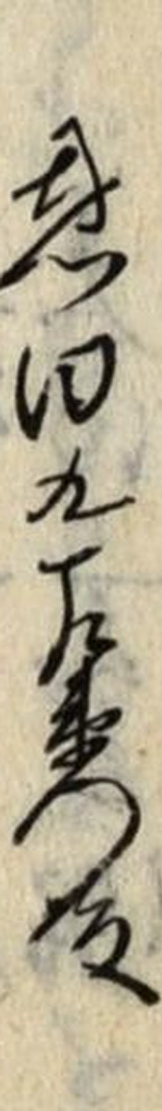恩田九左衛門殿
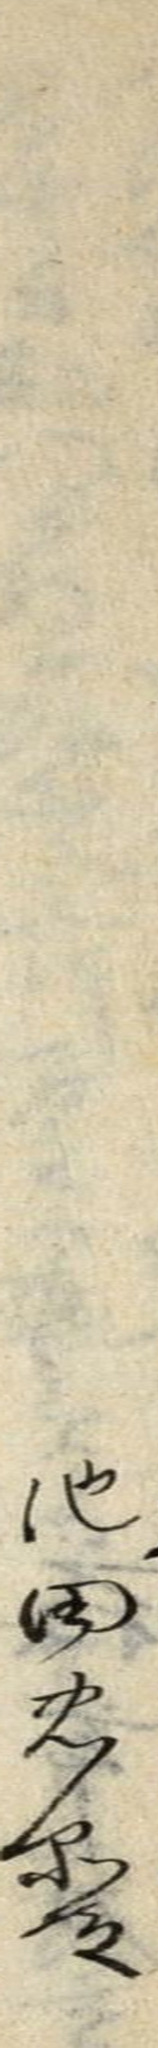池田忠兵衛殿
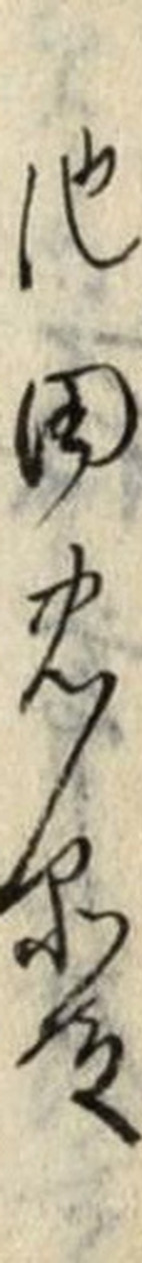池田忠兵衛殿
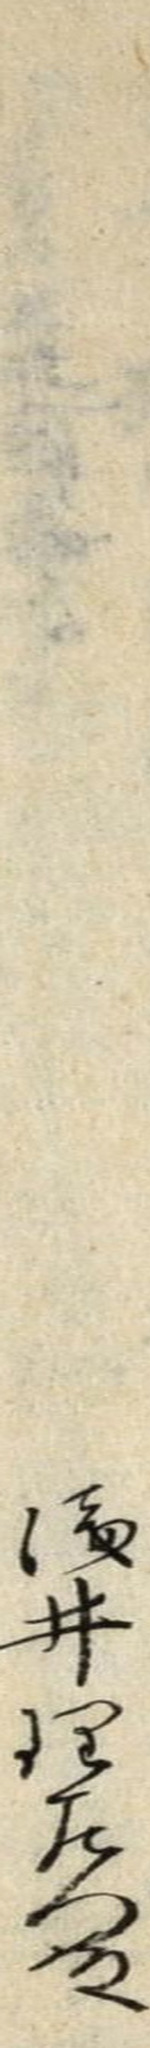浅井理左衛門殿
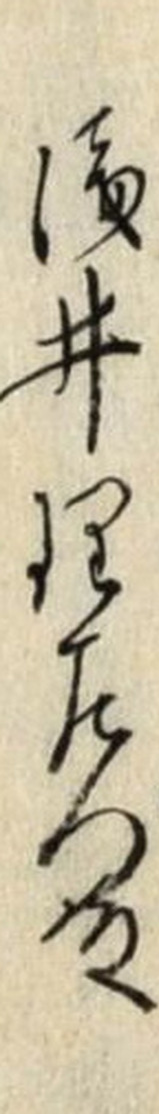浅井理左衛門殿
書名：三都并道中之部
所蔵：福井県文書館 Fukui Prefectural Archives
